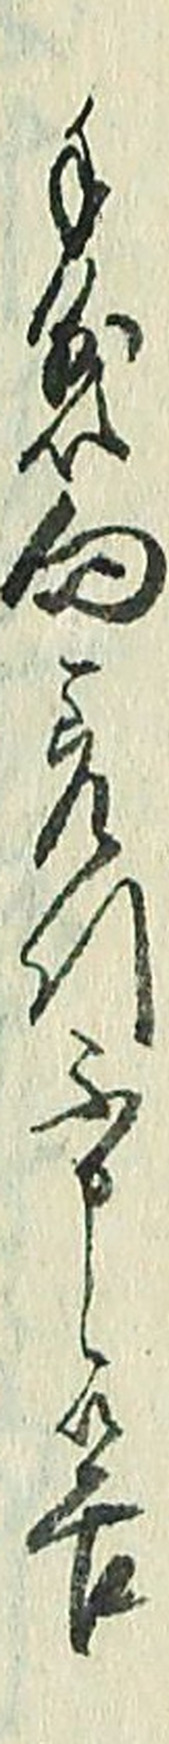手懸向差引不申候筈
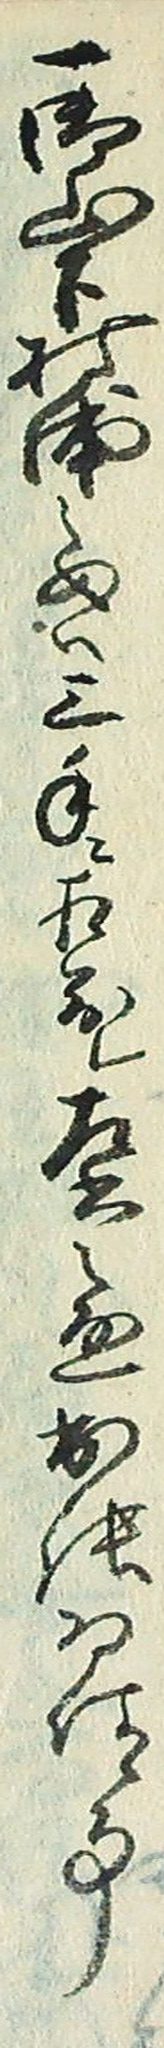一御山下村浦之義ハ三手ニ相別レ左書之通出張為仕候事
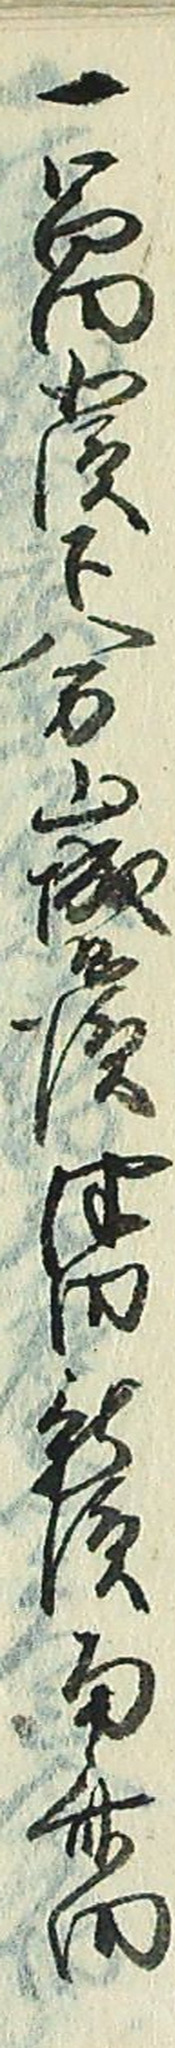一冨田北濱下八万山城屋濱津田新濱南斉田
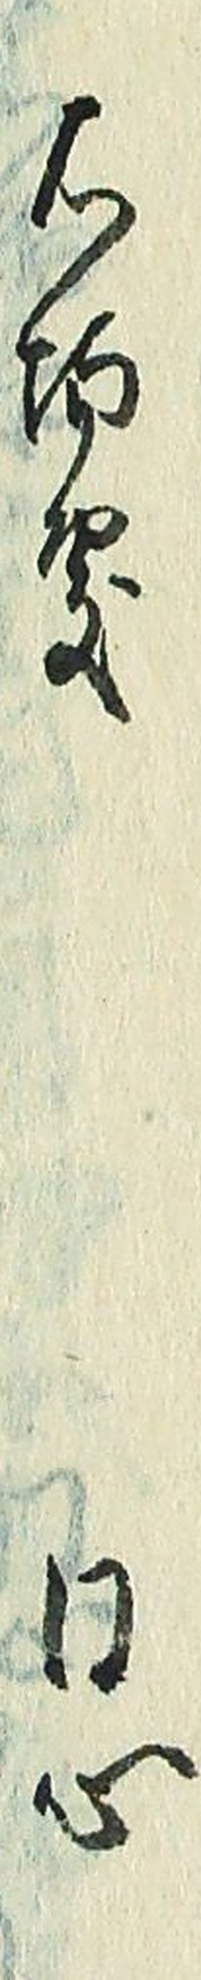右場處同心
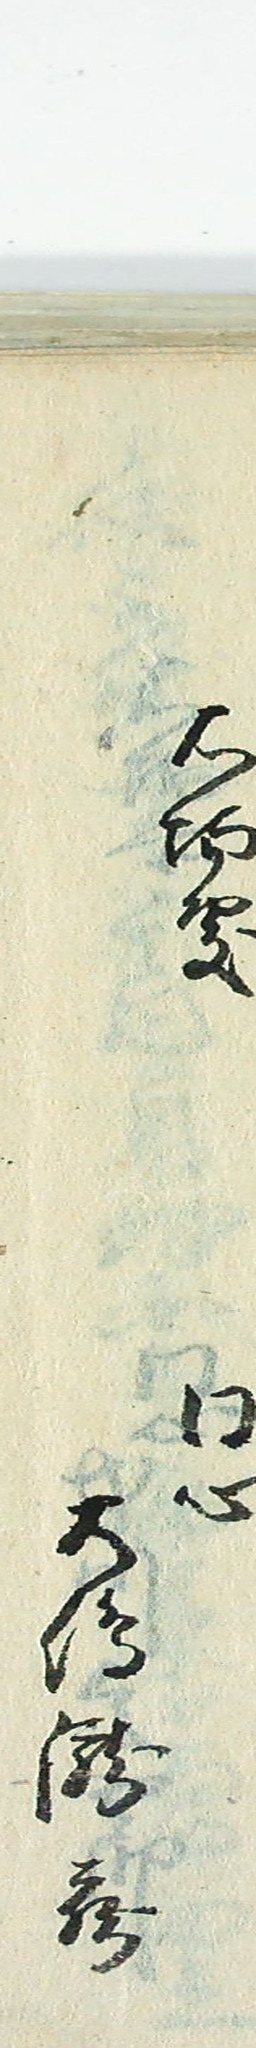大嶋瀧蔵
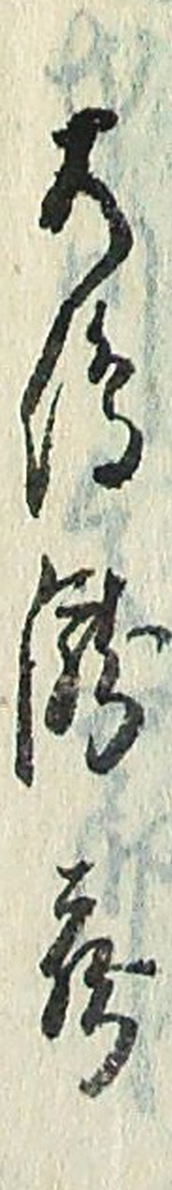大嶋瀧蔵
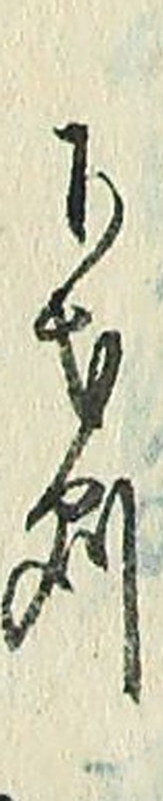下才判

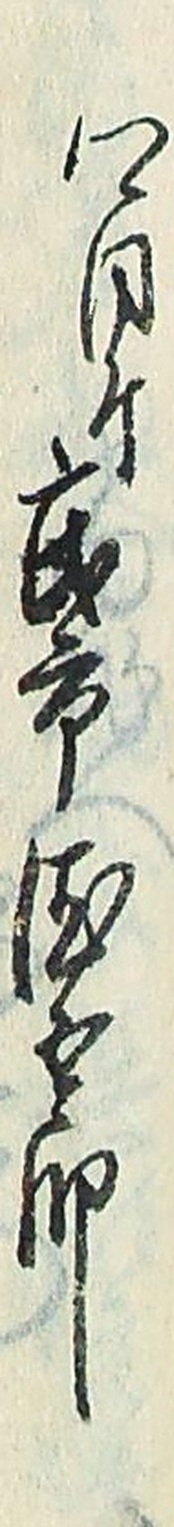武市徳五郎
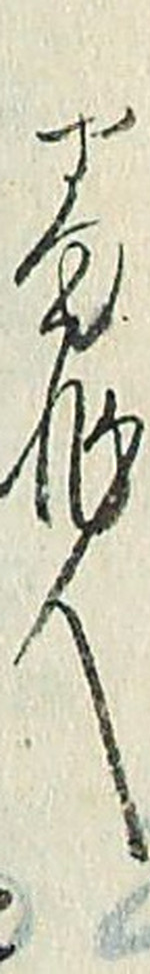番非人
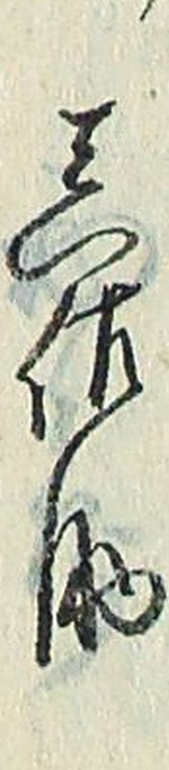真佐助
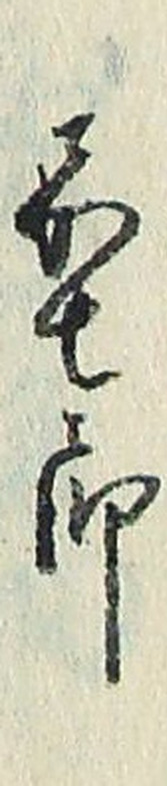嘉七郎
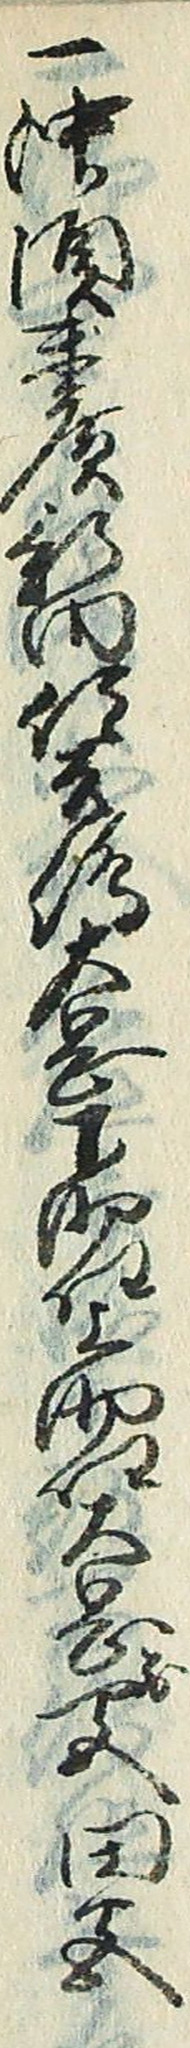一沖須末廣新内住吉嶋大岡下助任上助任大岡別宮田宮
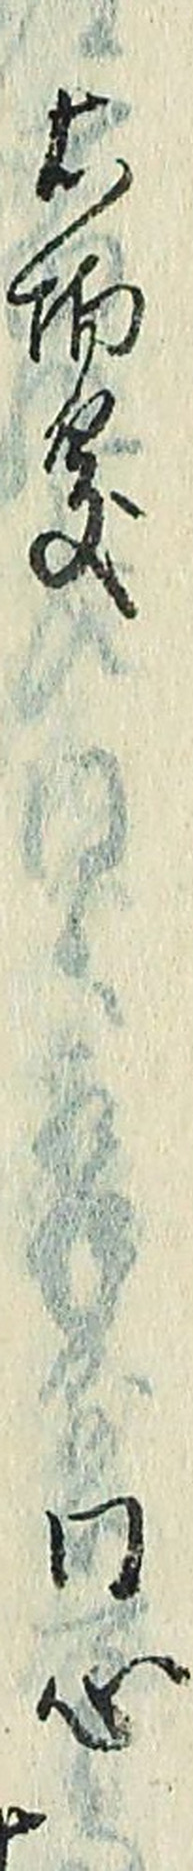右場處同心
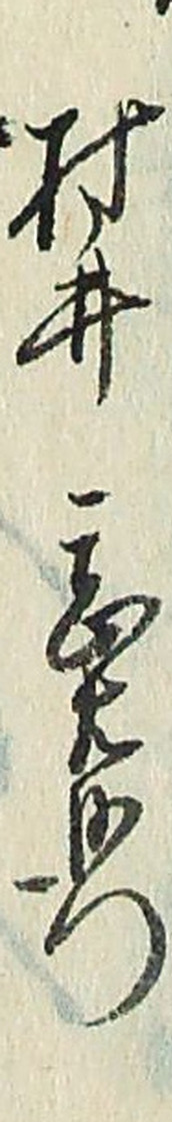村井甚右衛門
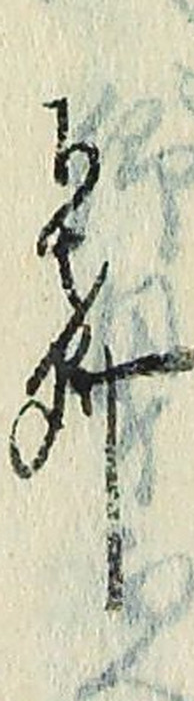下才判
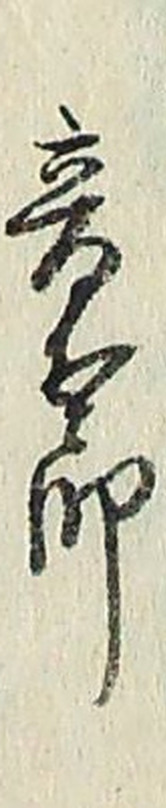音五郎
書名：諸御趣意書并御下知向之写
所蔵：鳴門教育大学 Naruto University of Education
